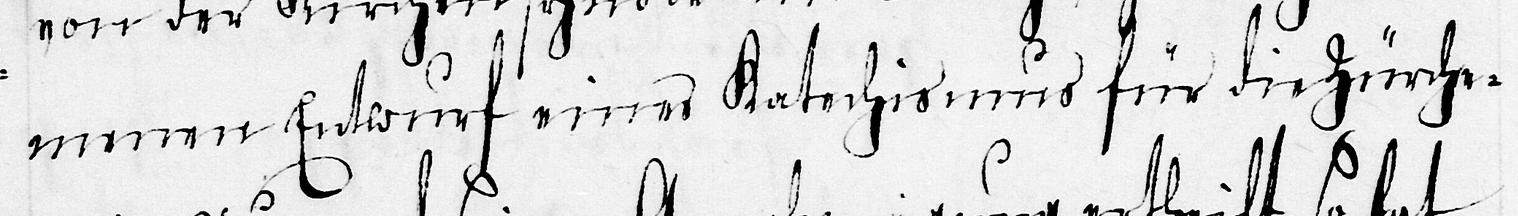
menen Entwurf eines Katechismus für die Zürche¬
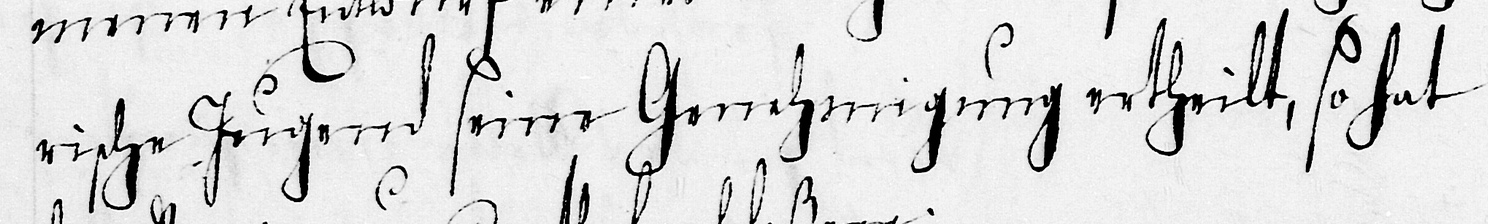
rische Jugend seine Genehmigung ertheilt, so hat
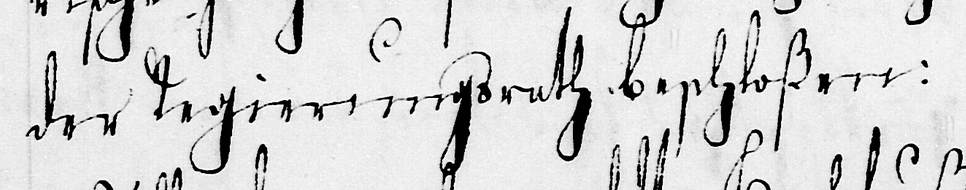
der Regierungsrath beschloßen:
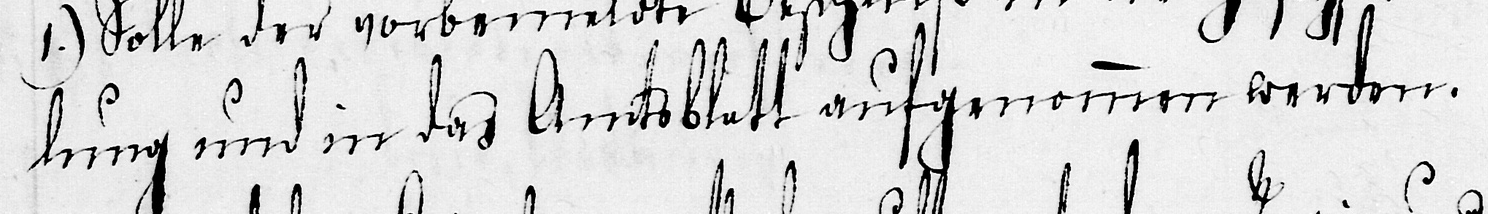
lung und in das Amtsblatt aufgenommen werden.
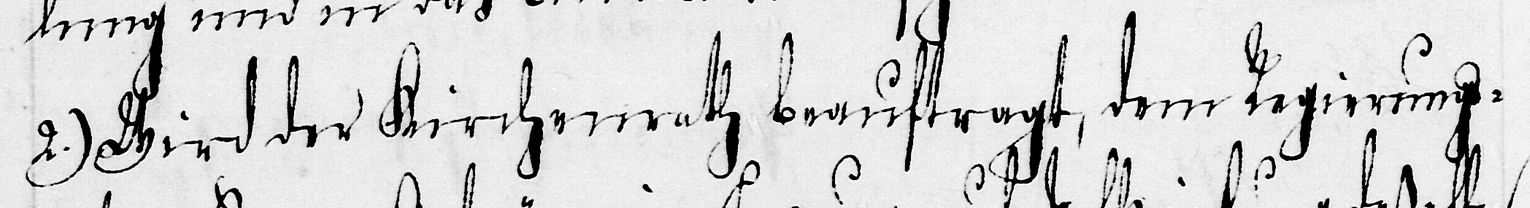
2.) Wird der Kirchenrath beauftragt, dem Regierungs¬
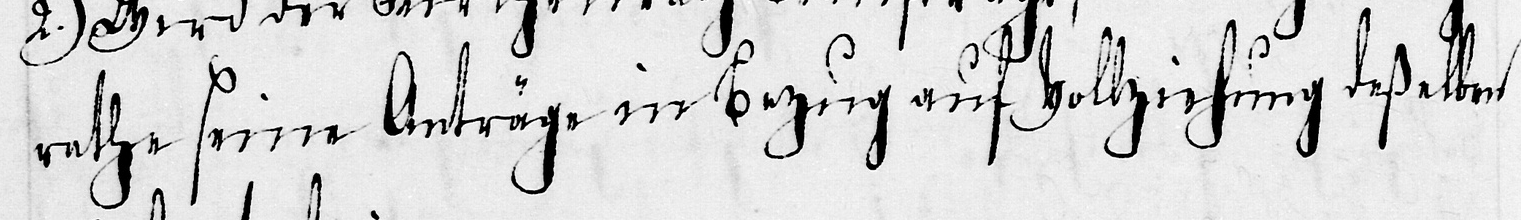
rathe seine Anträge in Bezug auf Vollziehung deßelben
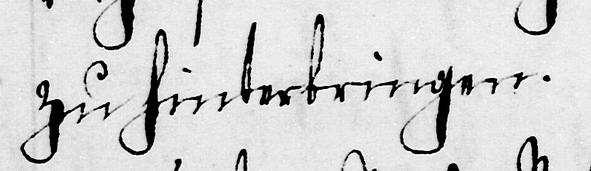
zu hinterbringen.
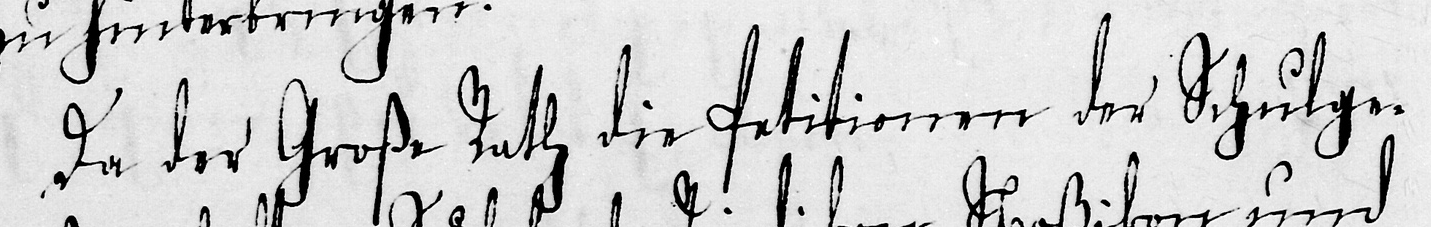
Da der Große Rath die Petitionen der Schulge¬
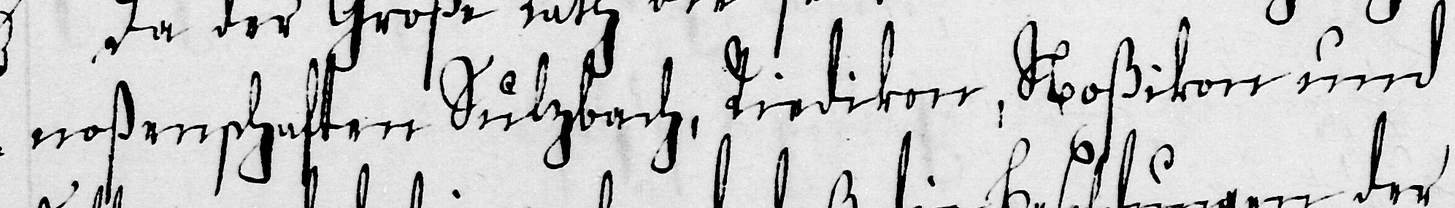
noßenschaften Sulzbach, Riedikon, Noßikon und
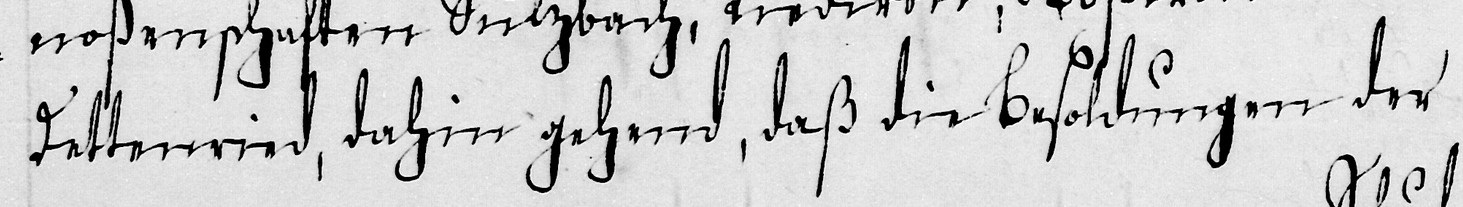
Dettenried, dahin gehend, daß die Besoldungen der
